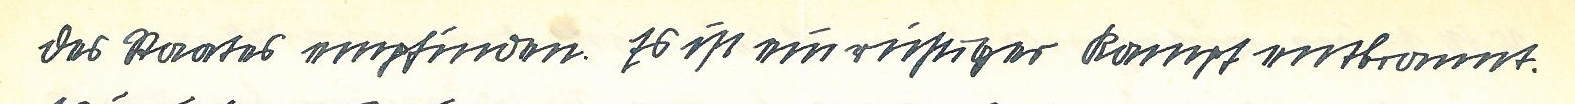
des Staates empfinden. Es ist ein richtiger Kampf entbrannt.
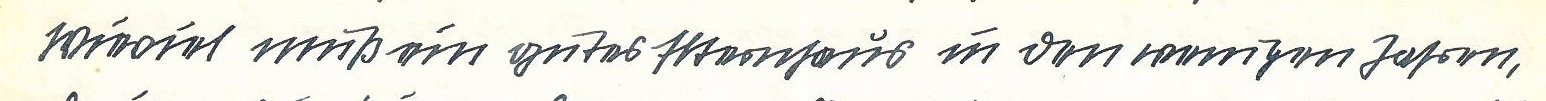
Wieviel muß ein gutes Elternhaus in den wenigen Jahren,
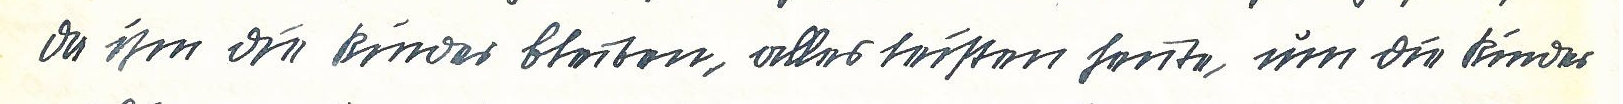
da ihm die Kinder bleiben, alles leisten heute, um die Kinder
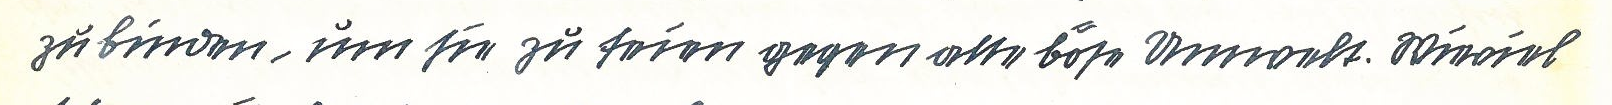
zu binden, um sie zu feien gegen alle böse Umwelt. Wieviel
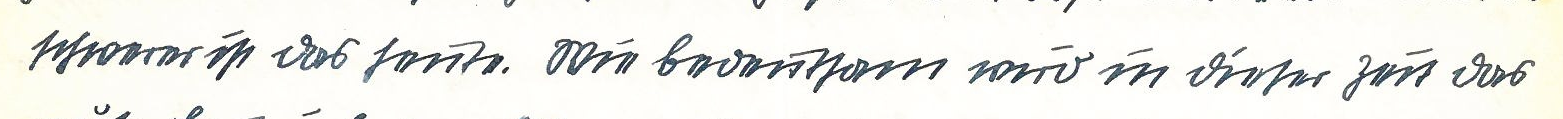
schwerer ist das heute. Wie bedeutsam wird in dieser Zeit das
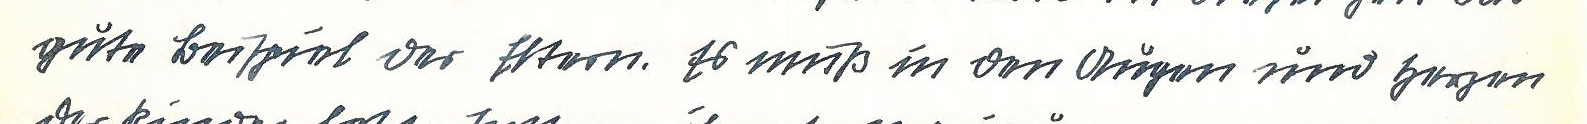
gute Beispiel der Eltern. Es muß in den Augen und Herzen
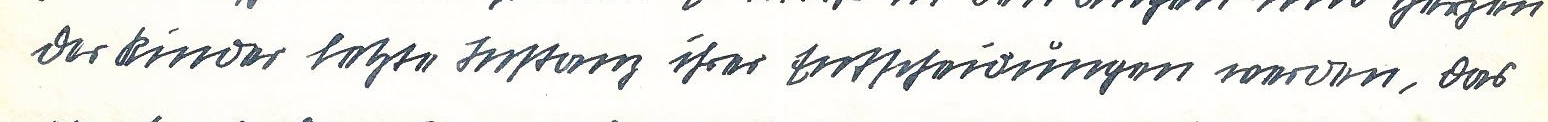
der Kinder letzte Instanz ihrer Entscheidungen werden, das
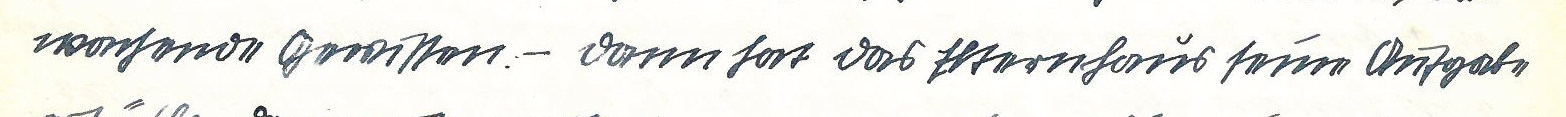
wachende Gewissen. – Dann hat das Elternhaus seine Aufgabe
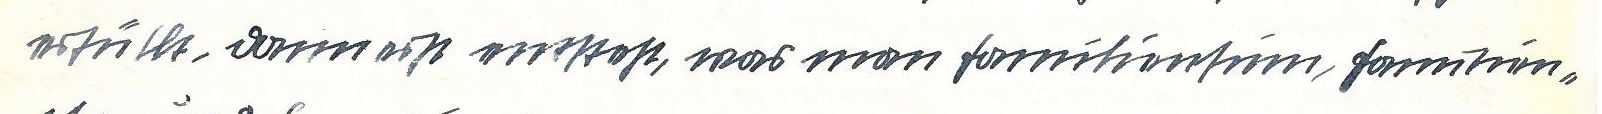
erfüllt, dann erst entsteht, was man Familiensinn, Familien¬
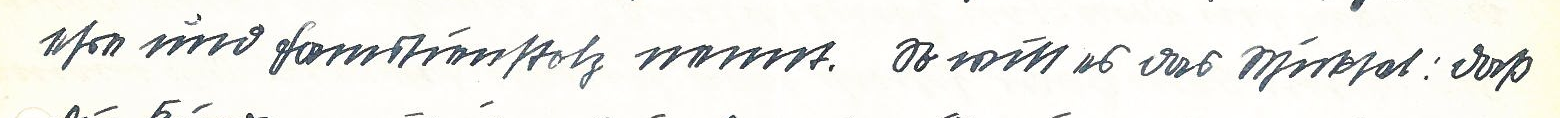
ehre und Familienstolz nennt. So will es das Schicksal: daß
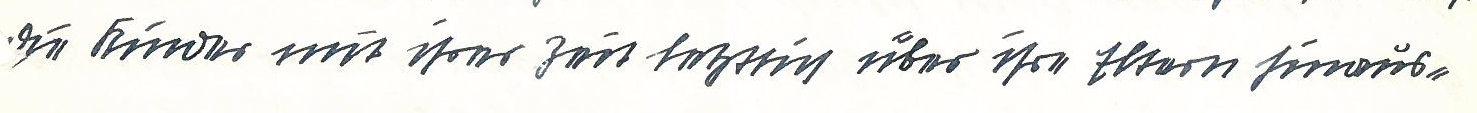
ie Kinder mit ihrer Zeit letztlich über ihre Eltern hinaus¬
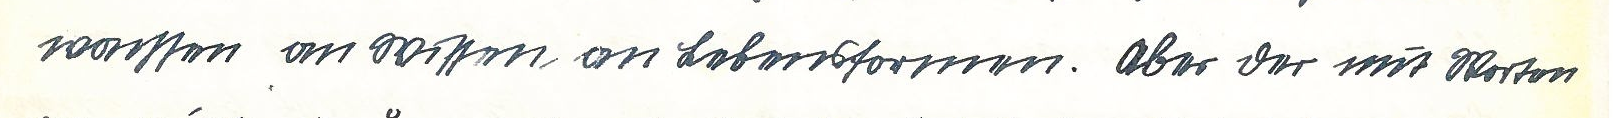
wachsen an Wissen, an Lebensformen. Aber der mit Worten
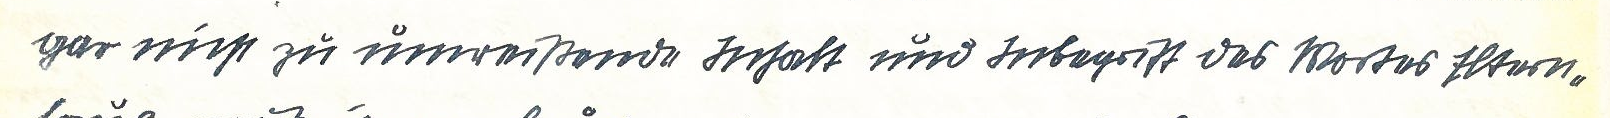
gar nicht zu umreißende Inhalt und Inbegriff des Wortes Eltern¬
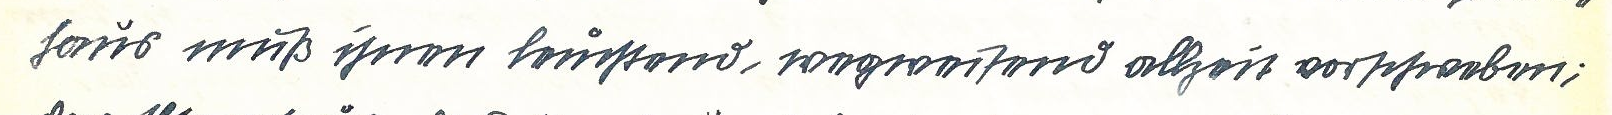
haus muß ihnen leuchtend, wegweisend allzeit vorschweben;
